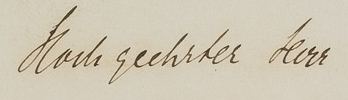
Hochgeehrter Herr
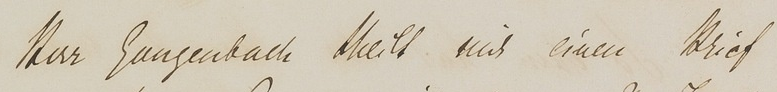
Herr Gonzenbach theilt mir einen Brief
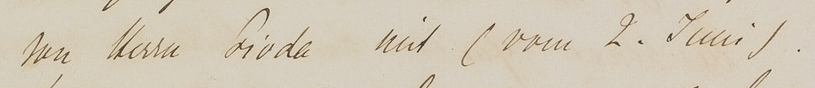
von Herrn Pioda mit (vom 2. Juni).
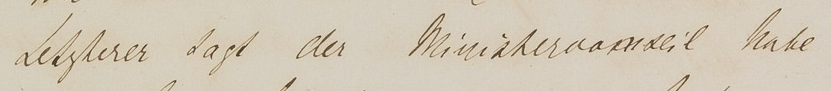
Letzterer sagt der Ministerconseil habe
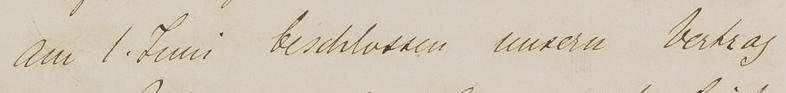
am 1. Juni beschlossen unsern Vertrag
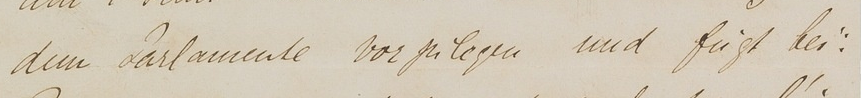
dem Parlamente vorzulegen und fügt bei:
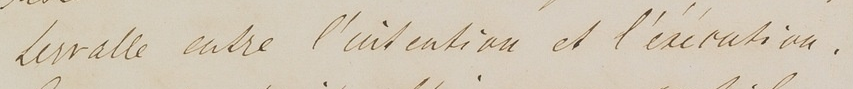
tervalle entre l'intention et l'execution.
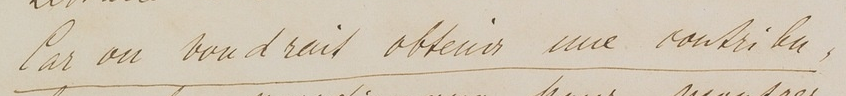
Car on voudrait obtenir une contribu-
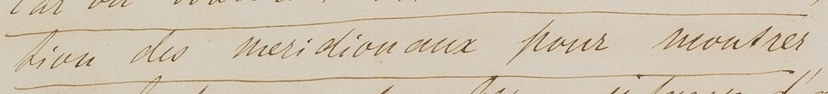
tion des meridionaux pour montrer
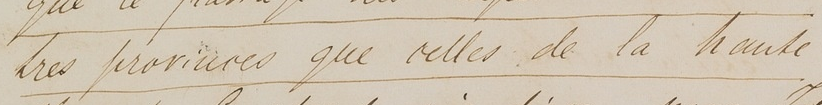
tres provinces que celles de la haute
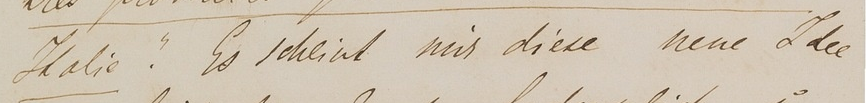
.» Es scheint mir diese neue Idee
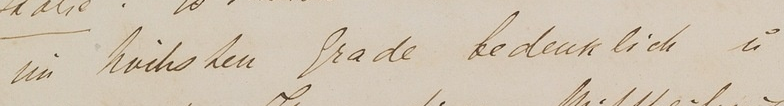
im höchsten Grade bedenklich u
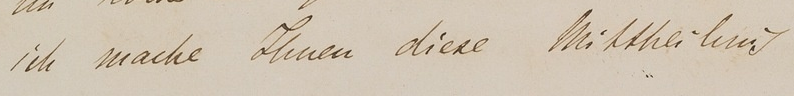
ich mache Ihnen diese Mittheilung
